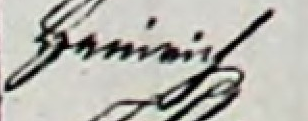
Heinrich
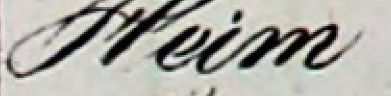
Heim
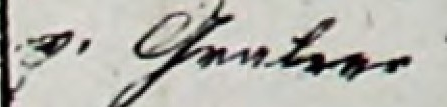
v. Gratrer
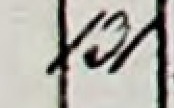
131
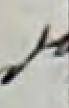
Do
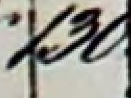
130
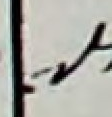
Do
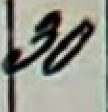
30
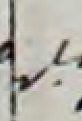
Do
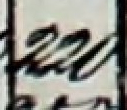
220
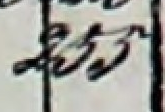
255
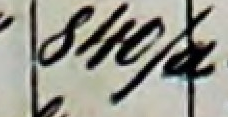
840/a
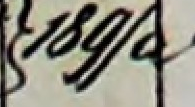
189/a
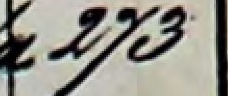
273
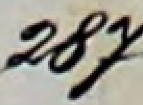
287
